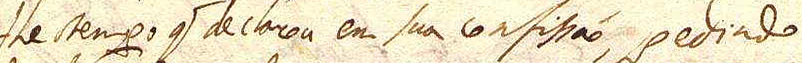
the o tempo q̄ declarou em sua confissaõ, pedindo
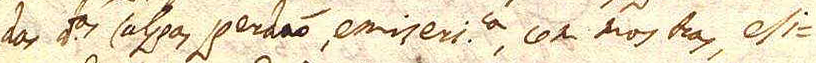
das d̄.as Culpas perdaõ, e mizeri.ca, com mostras, e si
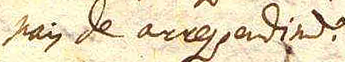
nais de arrependimto.
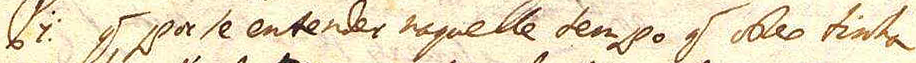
Pr: q̄ por se entender naquelle tempo q̄ o Reo tinha
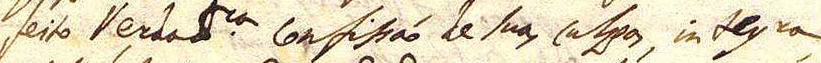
feito Verdad̄.ra confissaõ de suas culpas, inteyra
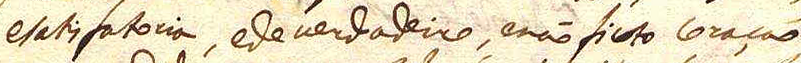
e satisfatoria, e de uerdadeiro, e naõ ficto coraçaõ
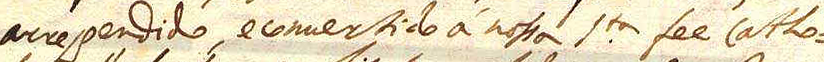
arrependido, e conuertido á nossa Sta. fee catho
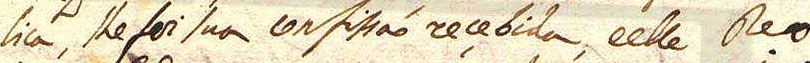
lica, lhe foi sua confissaõ reçebida, e elle Reo
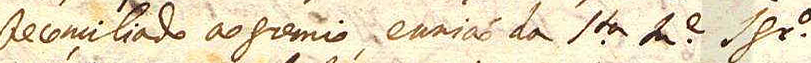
Reconçiliado ao gremio, e uniaõ da Sta. M.e Igr.a
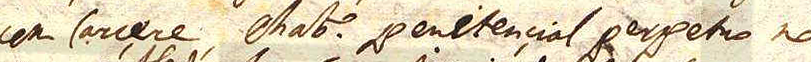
com Carçere, e hab̄o. penitençial perpetuo no
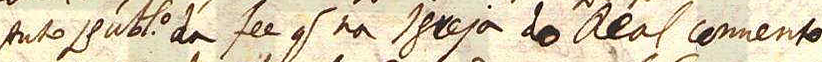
Auto publ.o da fee q̄ na Igreja do Real conuento
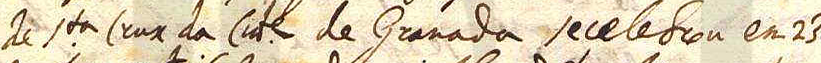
de Sta. Crux da Cid̄.e de Granada se çelebrou em 23.
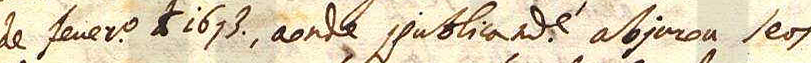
de feuer.o d̄ i673., aonde publicam.te abjurou seos
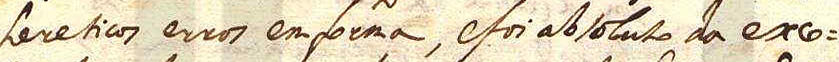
hereticos erros em forma, e foi absoluto da exco
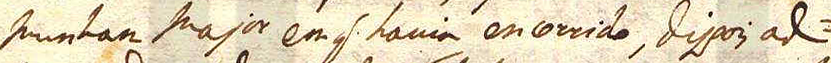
munhan Major em q̄. hauia encorrido, dipoiz ad
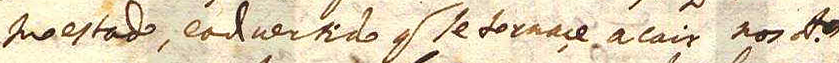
moestado, e aduertido q̄ se tornaçe a cair nos d̄.os
